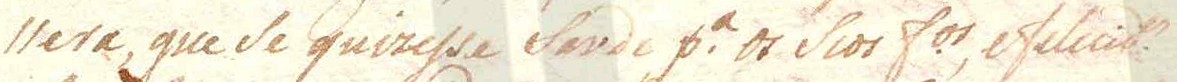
ssera, que se quizesse Savde p.a os Seos f.os, e felicid.es
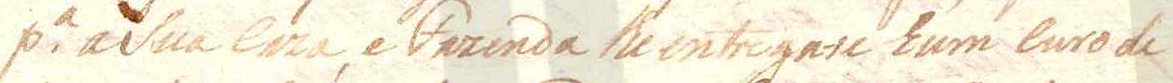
p.a a Sua Caza, e Fazenda lhe entregase hum Curo de
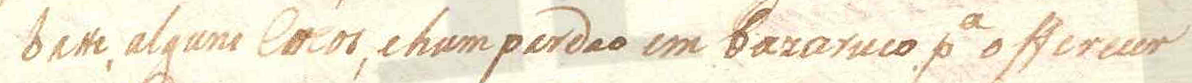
bethe, alguns Cocos, e hum pardao em bazaruco p.a offerecer
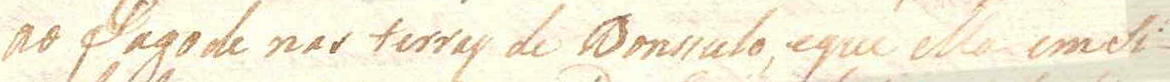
ao Pagode nas terras de Donssulo, e que ella em Si
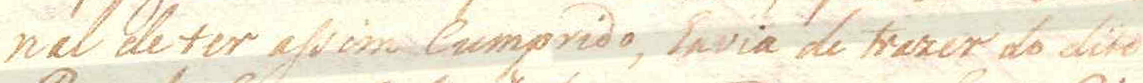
nal de ter assim Cumprido, havia de trazer do dito
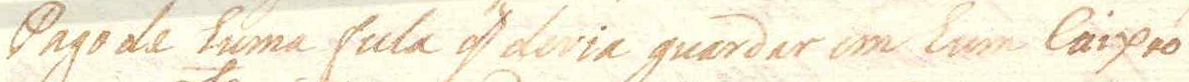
Pagode huma fula q̄ devia guardar em hum Caixaõ
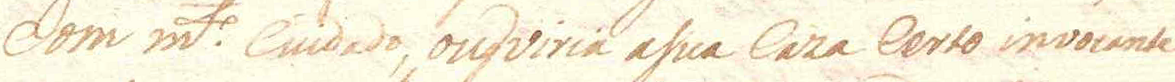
com m.to cuidado, ou q̄ viria a sua Caza Certo invocante
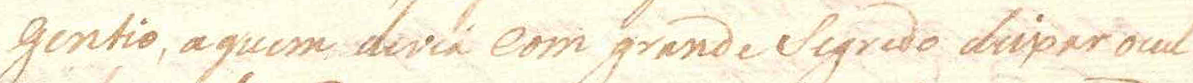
gentio, a quem devia com grande Segredo deixar ocul
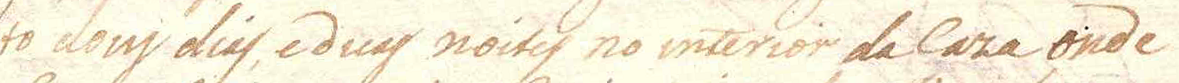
to dous dias, e duas noites no interior da Caza onde
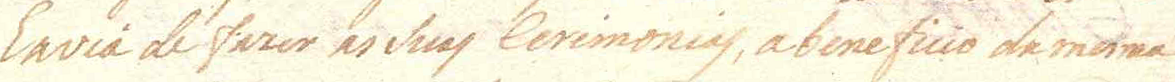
havia de fazer as suas Cerimonias, a beneficio da mesma
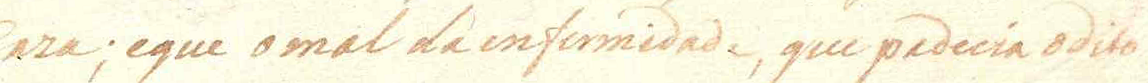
Caza; e que o mal da enfermidade, que padecia o dito
